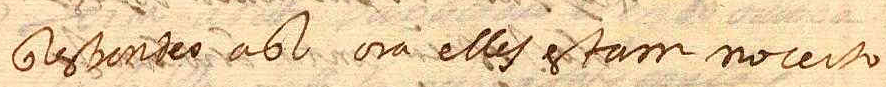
Respondeo a R ora elles estam no certo
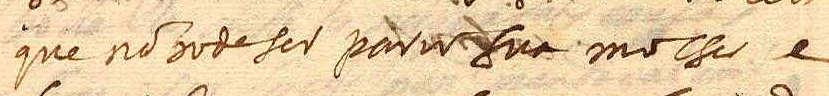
que nō pode ser parir sua molher e
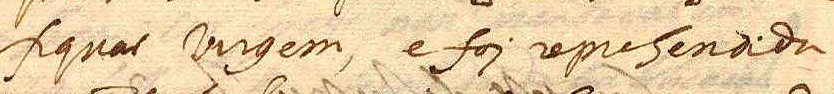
fiquar virgem, e foj reprehendida
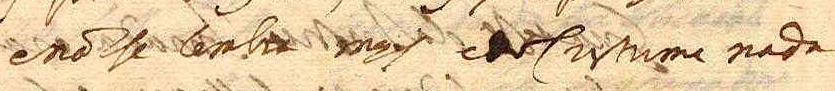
e nā se lembra mais e do Custume nada
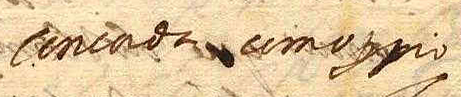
concorda com o ꝓpio
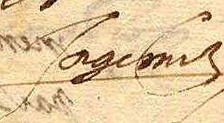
Jorge mīz
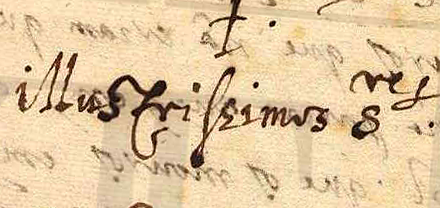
illustrissimos sres.
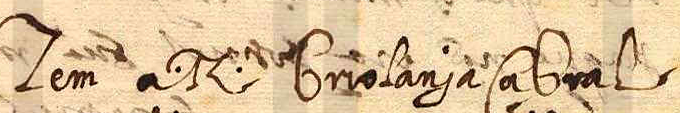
Tem a R. briolanja Cabral
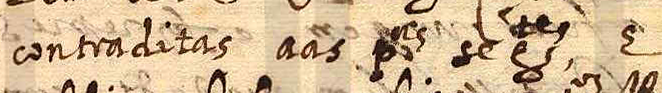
contraditas aas pas segtes, E
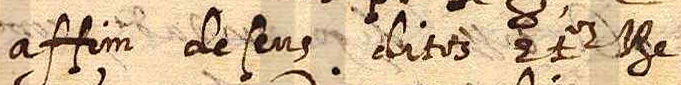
affim de seus ditos E tos lhe
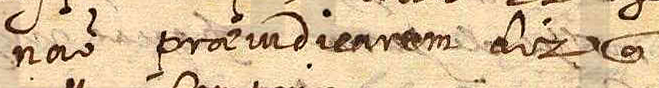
naõ præiudicarem diz q̄
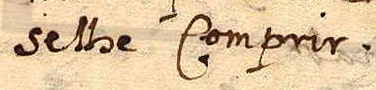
se lhe Comprir.
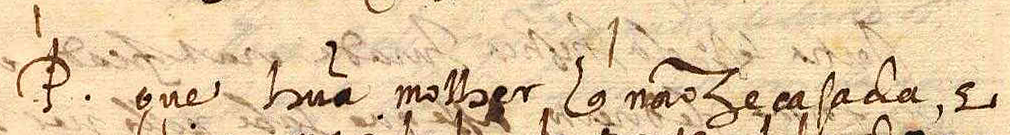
P. que huā molher q̄ não he casada, E
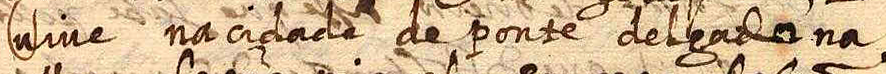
uiue na cidade de ponte delgada na
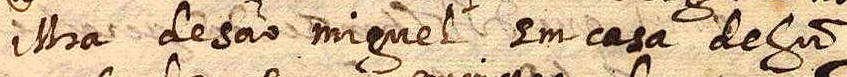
ilha de são miguel Em casa de hū
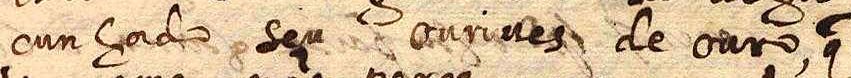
cunhado seu ouriues de ouro, q̄
